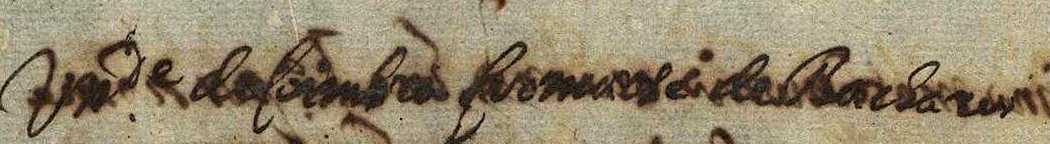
Vn.de de Coimbra fromarse de Bachares
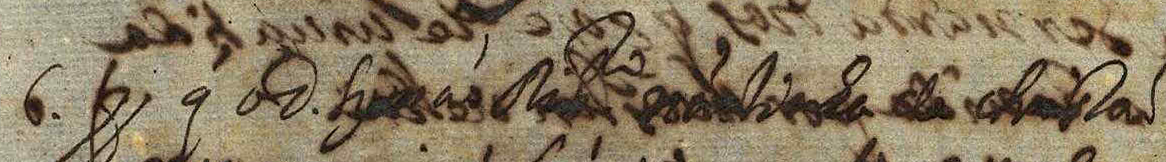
6. ꝓ q̄ o d. symaõ Ribro não tinha de christaõ
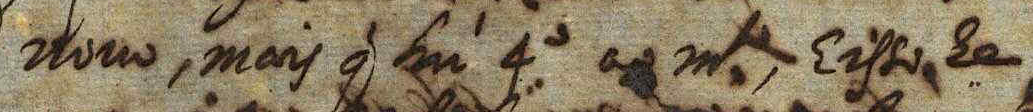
nouo, mais q̄ hū 4o ao mto, E isso he
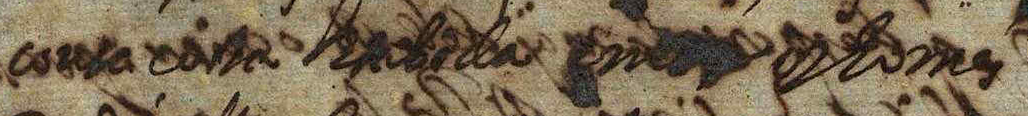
cousa certa E sabida entre os homēs
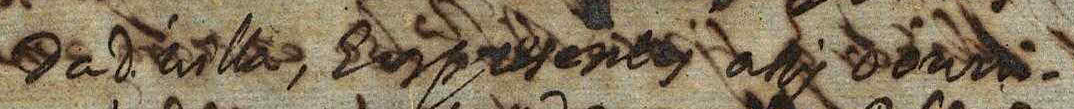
da d. uilla, E os presentes assy o ouui
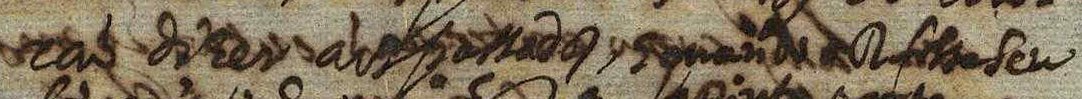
raõ dizer aos passados, E quando o R fosse seu
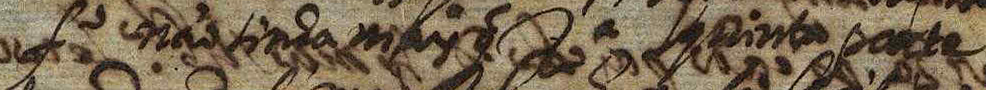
fo naõ tinha mais q̄ a quinta parte
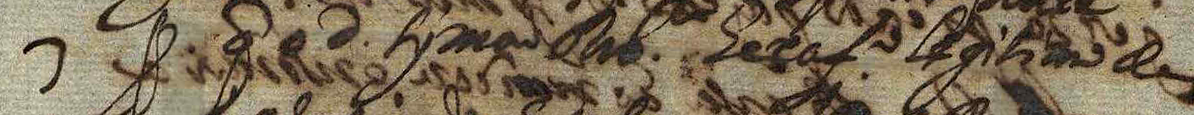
7 ꝓ q̄ o d. symaõ Rib.ro hera f.o legitimo de
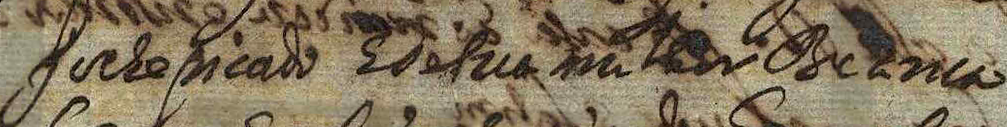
jorhe picado E de sua mulher Branca
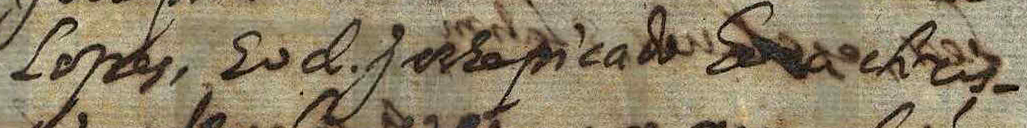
Lopes, E o d. jorhe picado hera chris
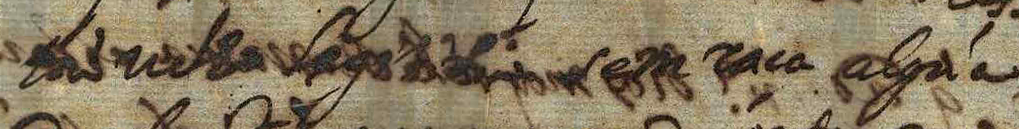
taõ uelho legitimo sem raça algūa
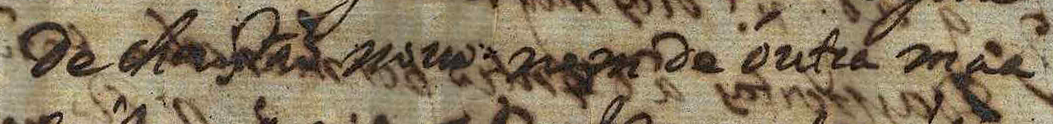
de christaõ nouo nem de outra maa
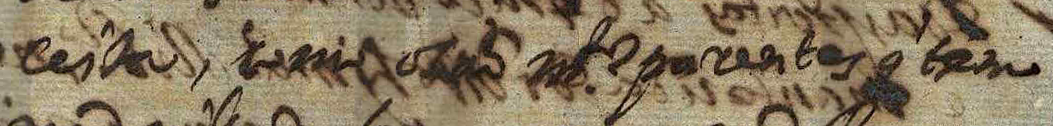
ceita, como o saõ m.tos parentes q̄ tem
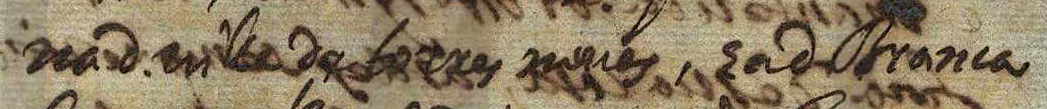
na d. uilla de torres nouas, E a d. Branca
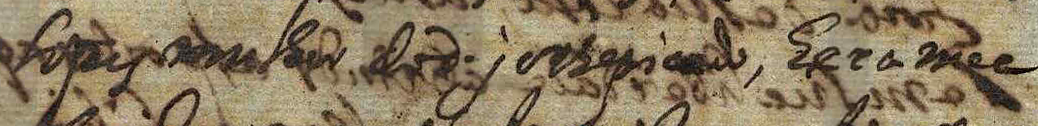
lopes mulher do d. jorhe picado, hera mea
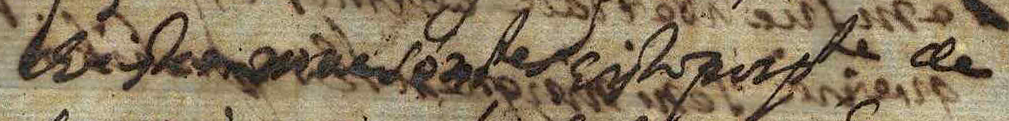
christan noua somtes E isto por pte de
